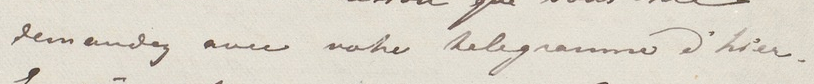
demandez avec votre telegramme d'hier –
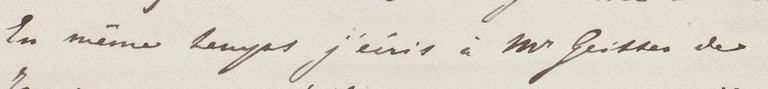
En même temps j'écris à MrGeisser de
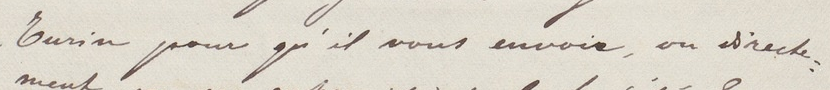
Turin pour qu'il vous envoie, ou directe-
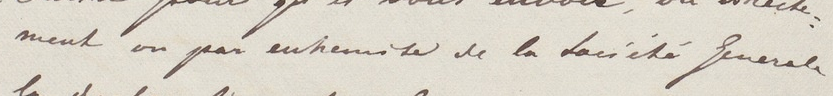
ment ou par entremise de la Société Generale
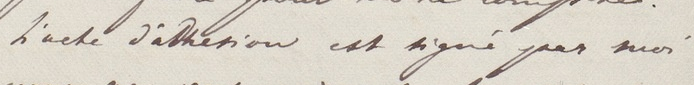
L'acte d'adhesion est signé par moi
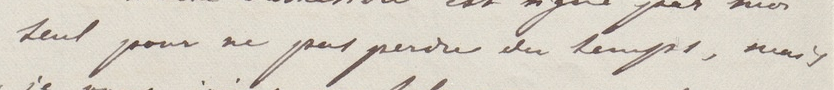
seul pour ne pas perdre du temps, mais
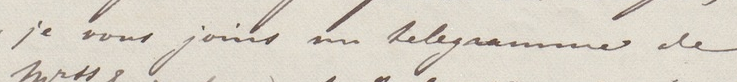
je vous joins un telegramme de
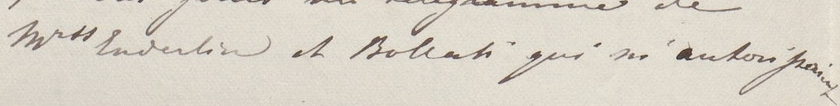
MrssEnderlin et Bollati qui m'autorissaient
